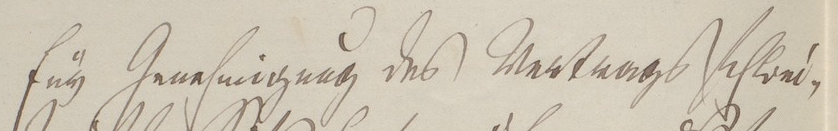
für Genehmigung des Vertrags schwei-
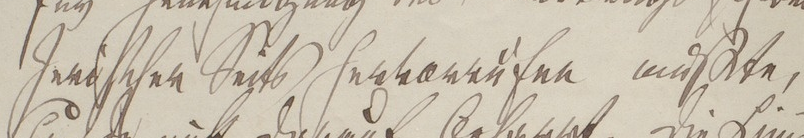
zerischer Seits hervorrufen müßte,
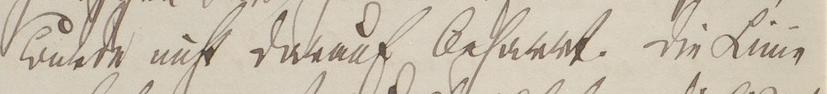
wurde nicht darauf beharrt. Die Linie
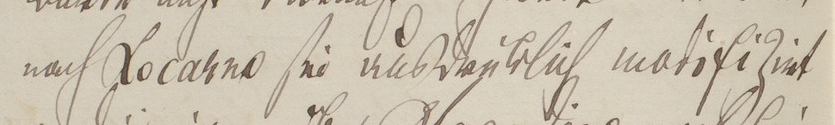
nach Locarno sei ausdrücklich modifizirt
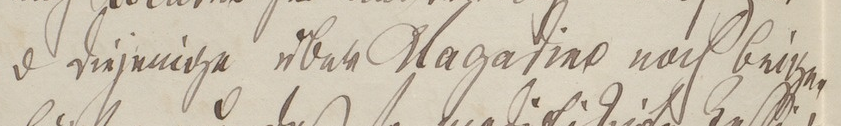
& diejenige über Magadino noch beige-
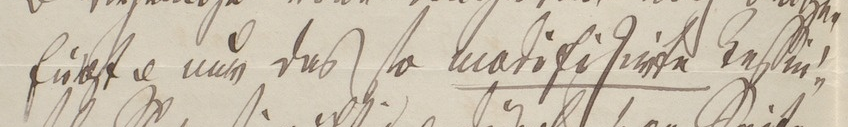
fügt & nur das so modifizirteTessin'-
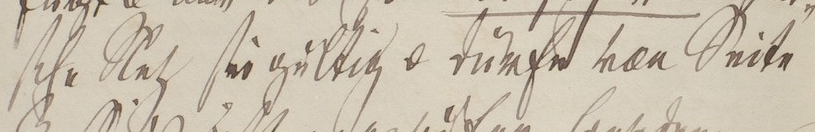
sche Netz sei gültig & dürfe von Seite
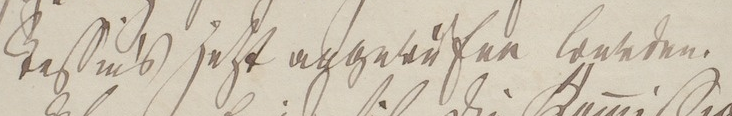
Tessin's jetzt angerufen werden.
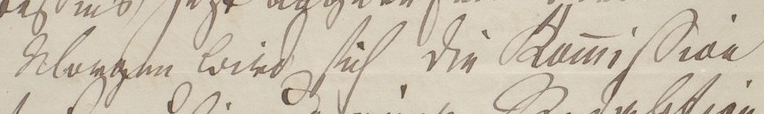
Morgen wird sich die Kommission
